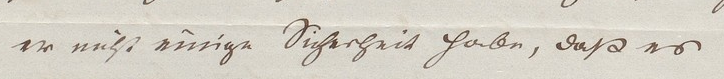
er nicht einige Sicherheit habe, daß es
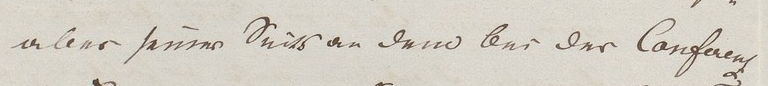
aber seiner Seits an dem bei der Conferenz
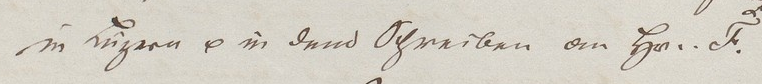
in Luzern & in dem Schreiben von Hrn. F.
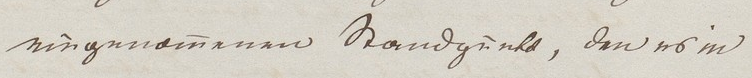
eingenommenen Standpunkt, den es in
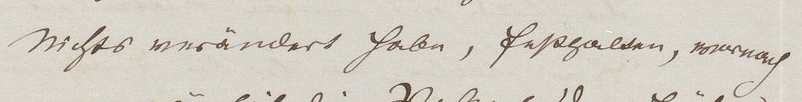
Nichts verändert habe, festhalten, wornach
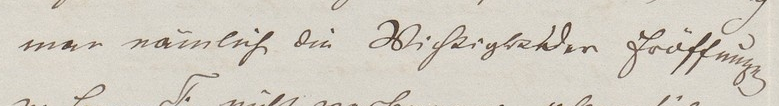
man nämlich die Wichtigkeit der Eröffnungen
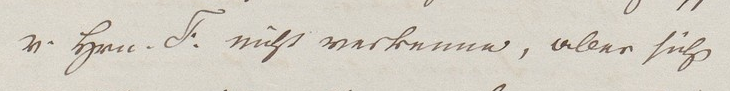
v. Hrn. F. nicht verkenne, aber sich
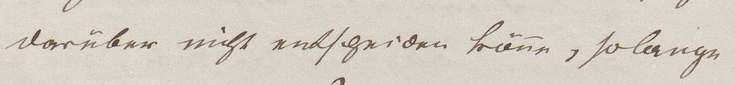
darüber nicht entscheiden könne, solange
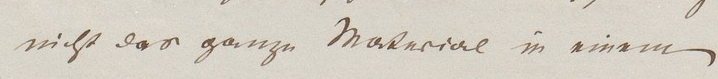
nicht das ganze Material in einem
